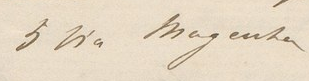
5 Via Magenta
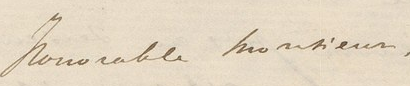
Honorable Monsieur,
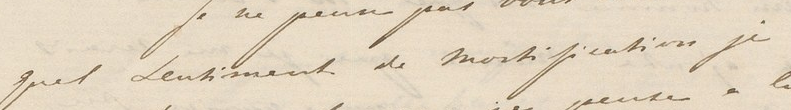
quel sentiment de mortification je
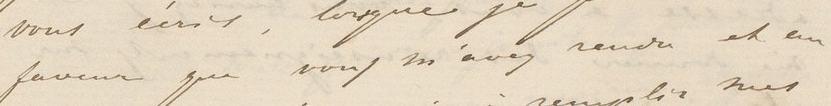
faveur que vous m'avez rendu et au
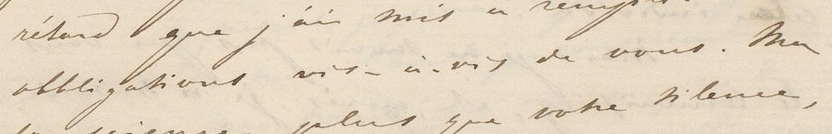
obligations vis-à-vis de vous. Ma
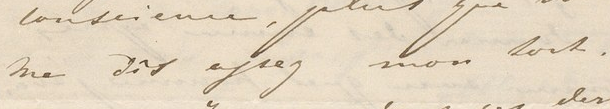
me dît assez mon tort.
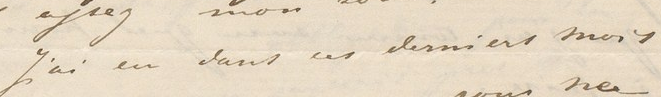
J'ai eu dans ces derniers mois
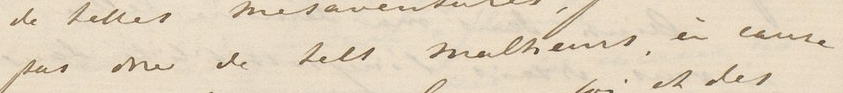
pas dire de tels malheurs, à cause
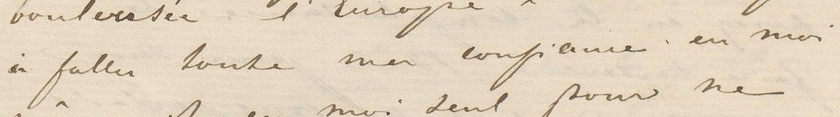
a fallu toute ma confiance en moi
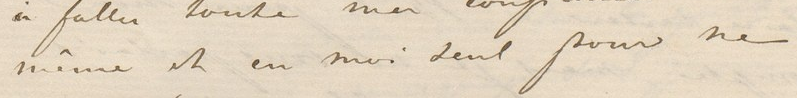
même et en moi seul pour ne
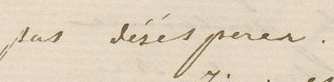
pas désésperer.
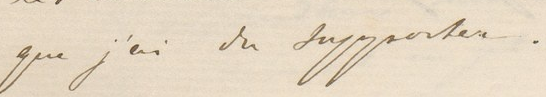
que j'ai du supporter.
